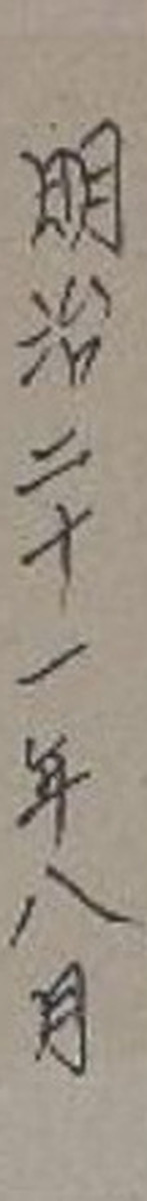明治二十一年八月
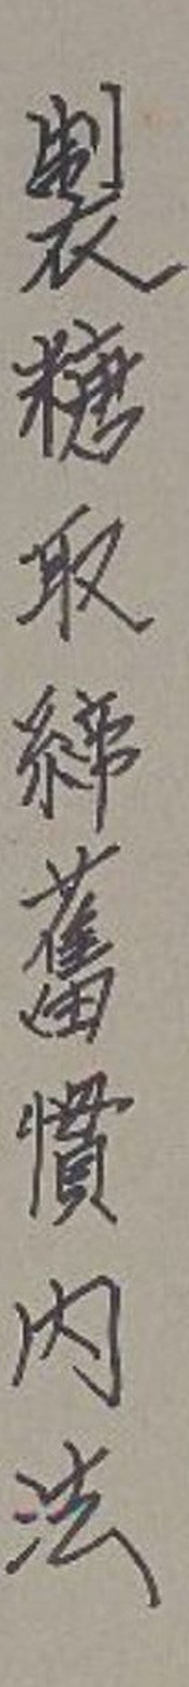製糖取締旧慣内法
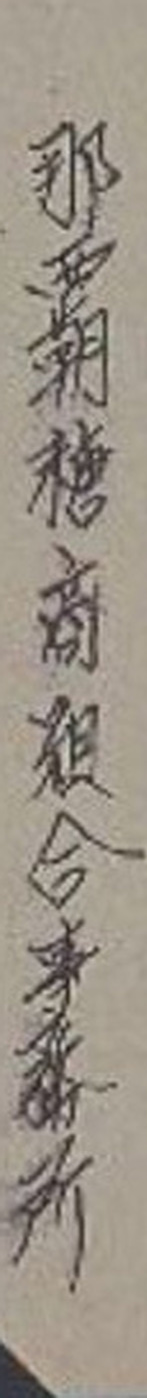那覇糖商組合事務所

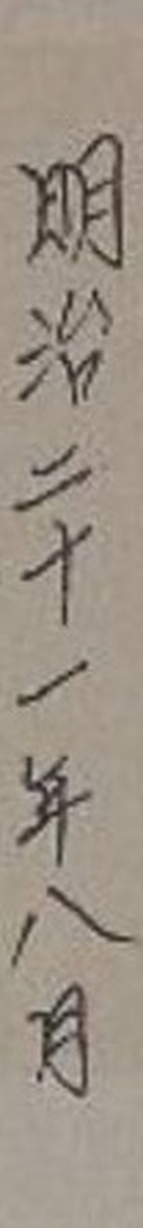明治二十一年八月
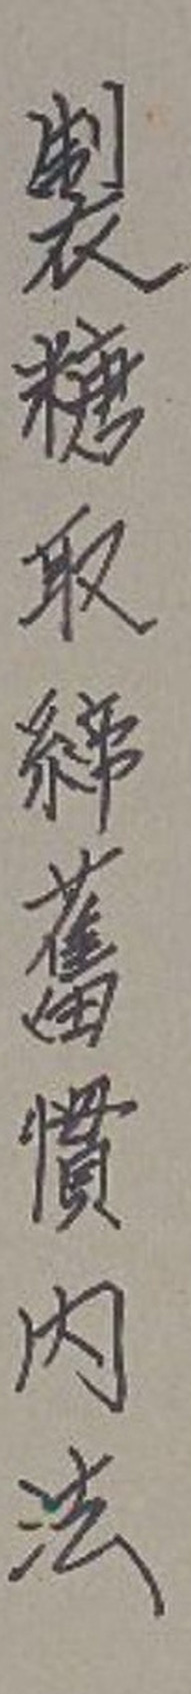製糖取締旧慣内法
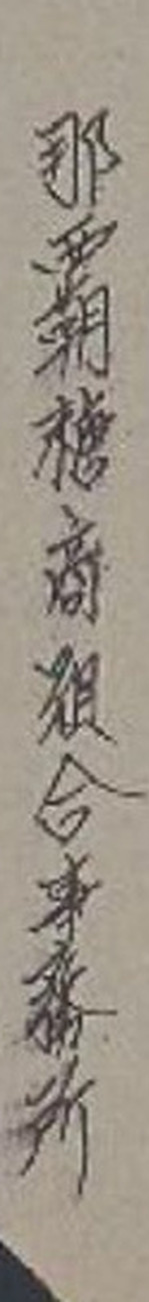那覇糖商組合事務所

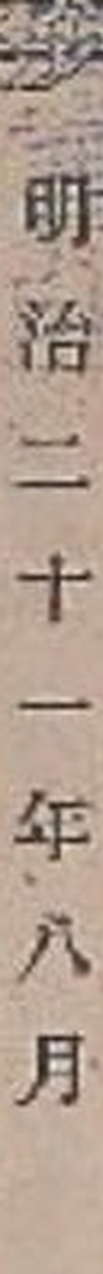明治二十一年八月
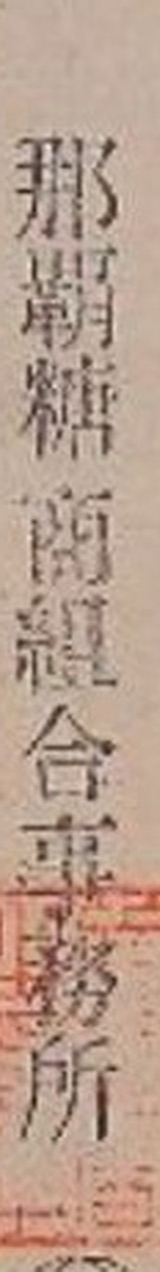那覇糖商組合事務所

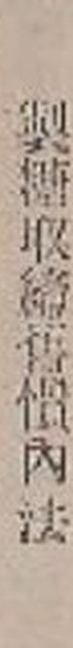製糖取締旧慣内法
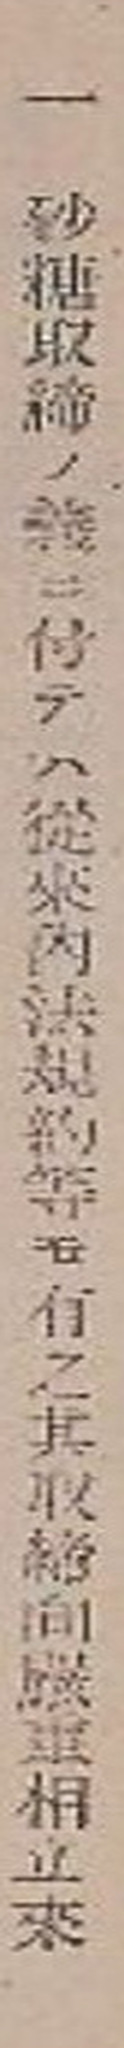一砂糖取締ノ義ニ付テハ従来内法規約等モ有之其取締向厳重相立來
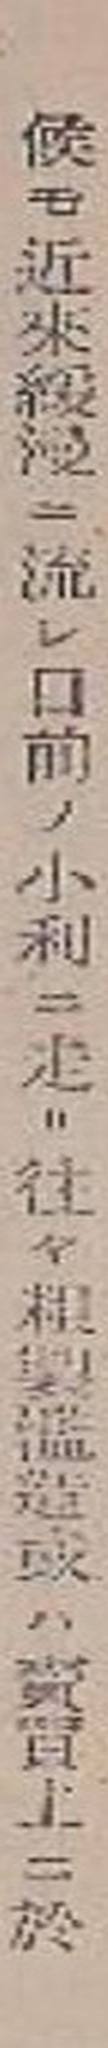候モ近來緩漫ニ流レ目前ノ小利ニ走リ往々粗製濫造或ハ賣買上ニ於
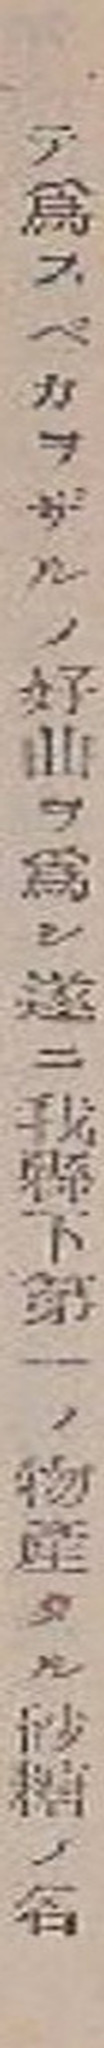テ爲スべカラザルノ好曲ヲ爲シ遂ニ我縣下第一ノ物産タル砂糖ノ名
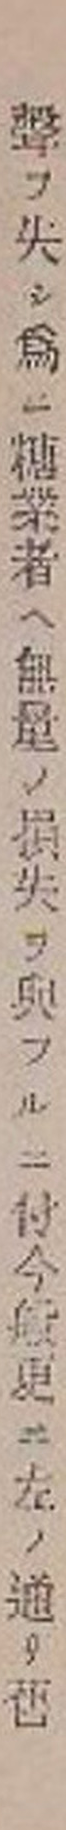聲ヲ失シ爲ニ糖業者ヘ無量ノ損失ヲ與フルニ付今般更ニ左ノ通リ旧
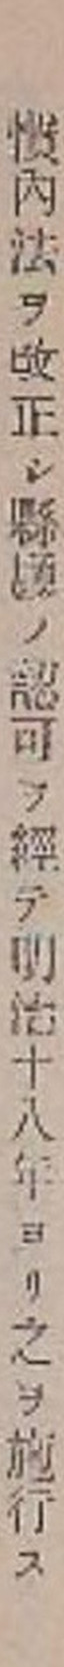慣内法ヲ改正シ縣庁ノ認可ヲ經テ明治十八年ヨリ之ヲ施行ス
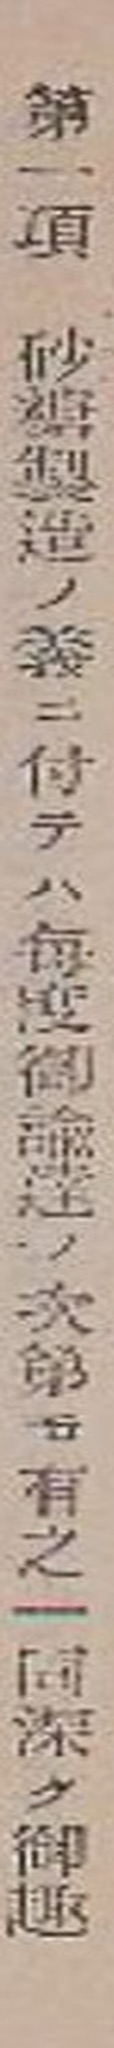第一項砂糖製造ノ義ニ付テハ毎度御諭達ノ次第モ有之一同深ク御趣
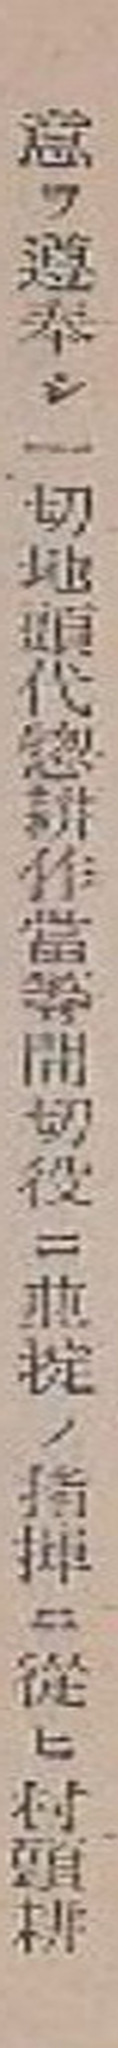意ヲ遵奉シ一切地頭代惣耕作當等間切役ニ並掟ノ指揮ニ從ヒ村頭耕
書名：製糖取締旧慣内法
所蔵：University of the Ryukyus Library
